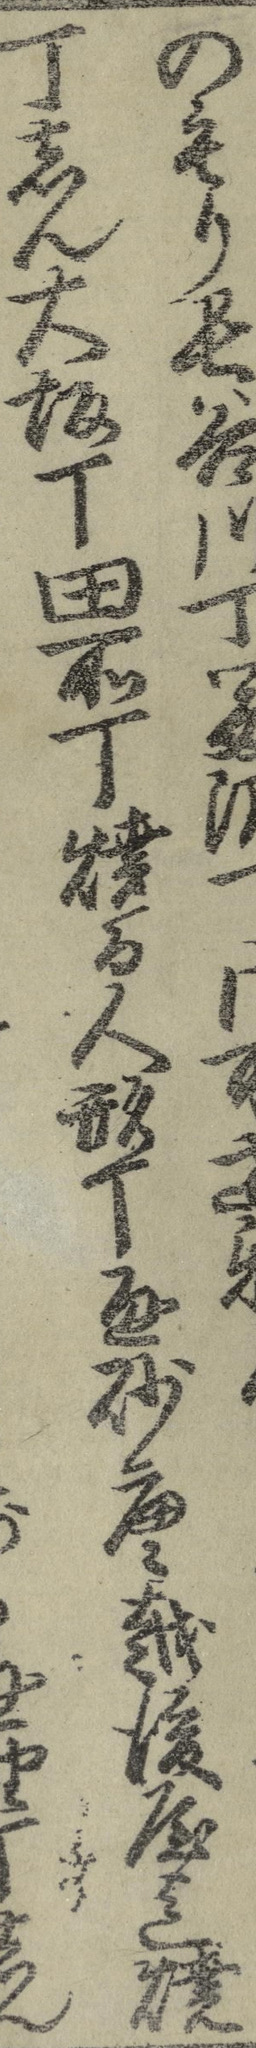丁しん大坂丁田所丁焼る人形丁通砂唐越後屋迄焼
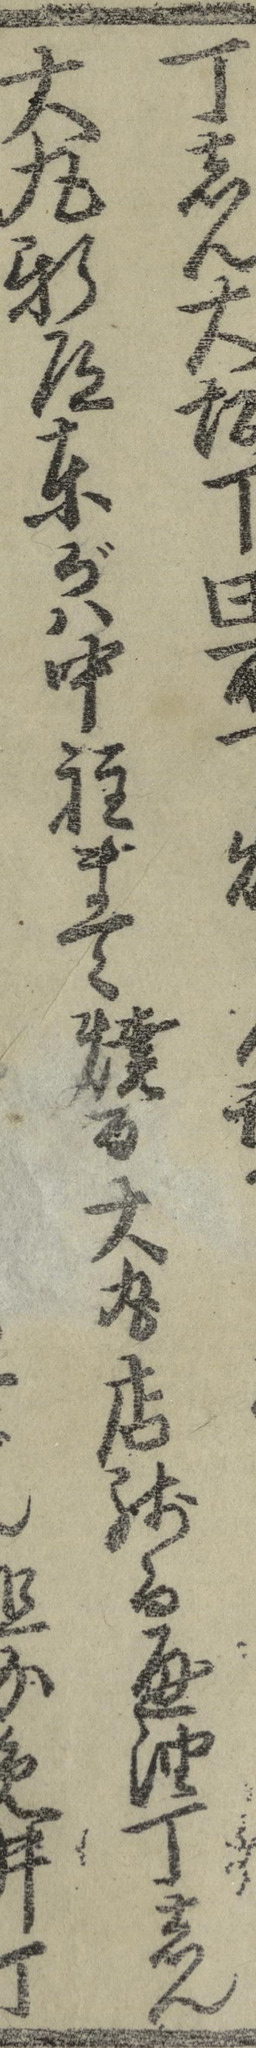大丸新道東がは中程まて焼る大丸店残る通油丁しん
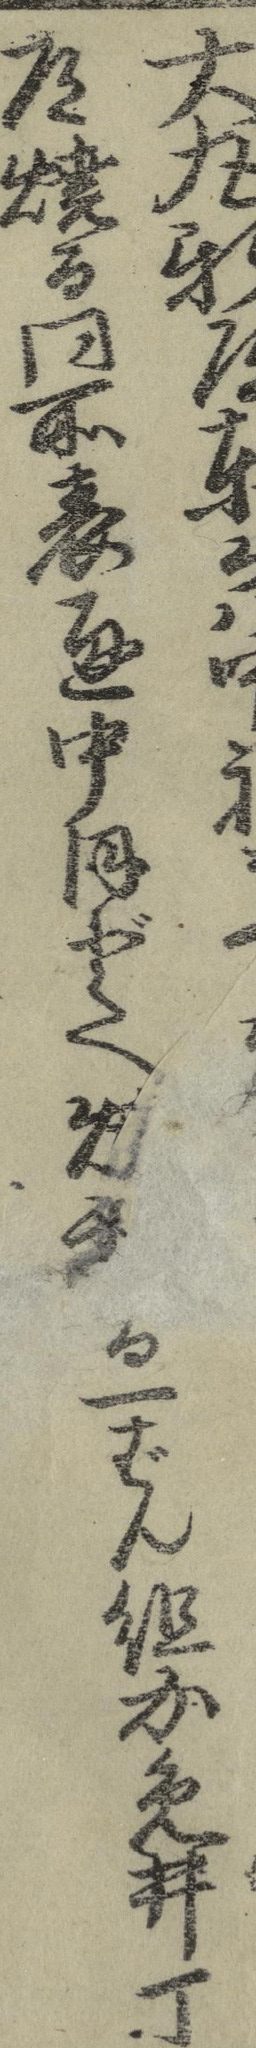道焼る同所表通中ほどへ焼移る一ばん組かめ井丁
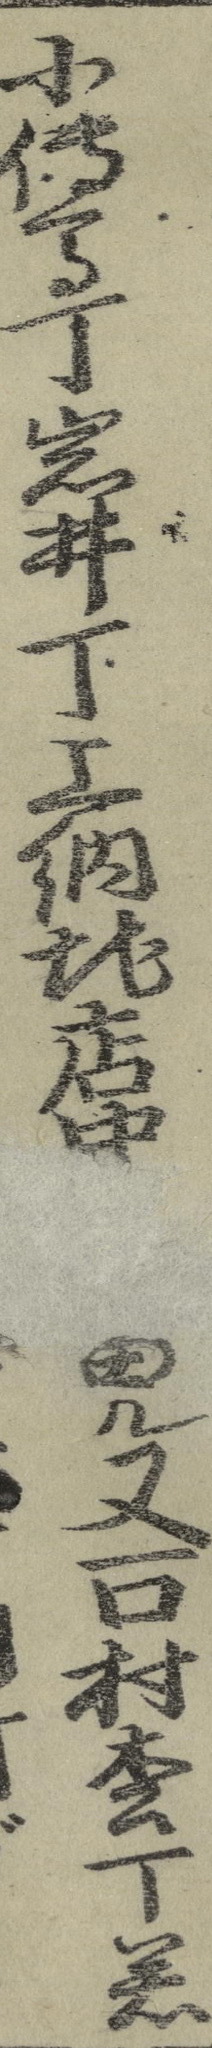小伝馬丁岩井丁上納地店中留ル又一口村松丁若
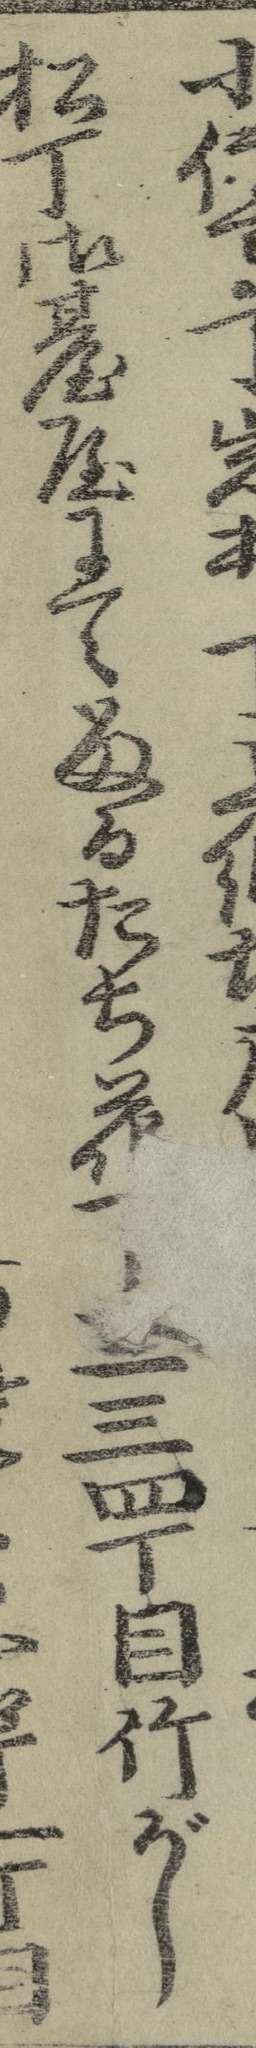松丁御台屋にて留るたち花丁二三四丁目竹がし
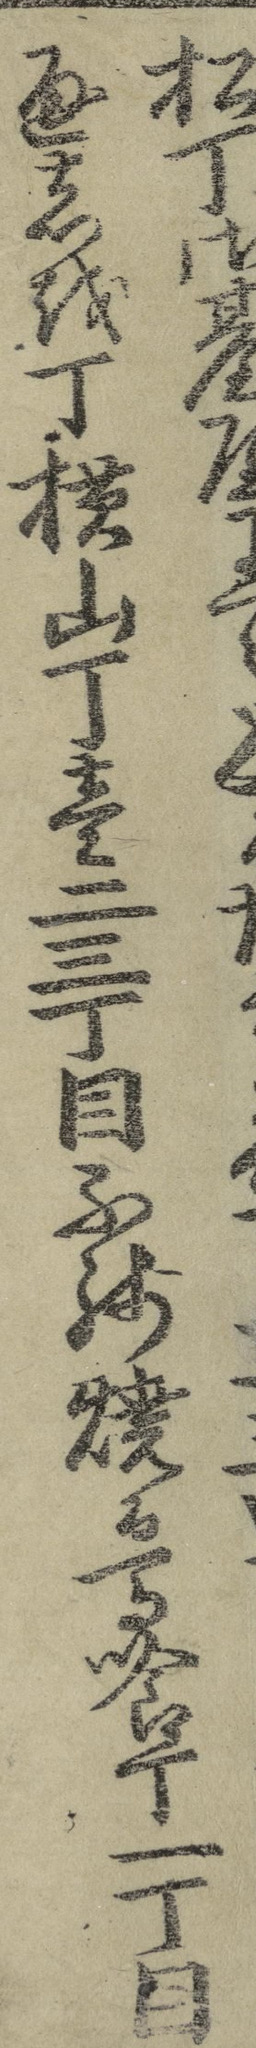通しお丁横山丁壱二三丁目不残焼る馬喰丁一丁目
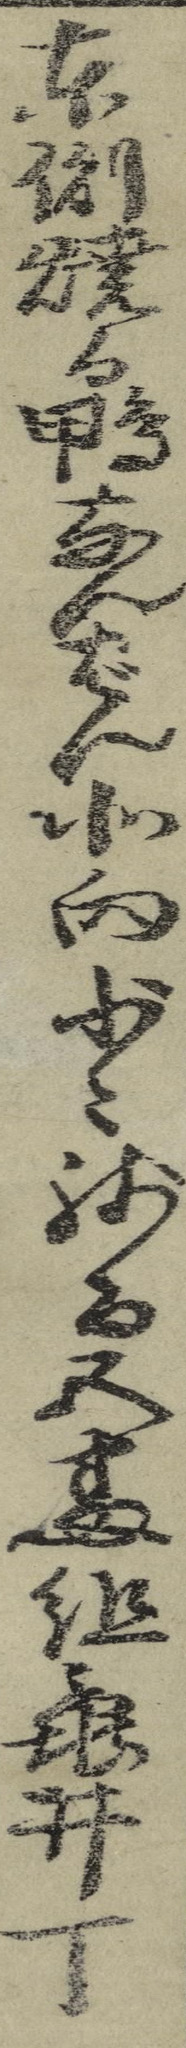東側焼る鴨なんばん北向少々残る五番組亀井丁
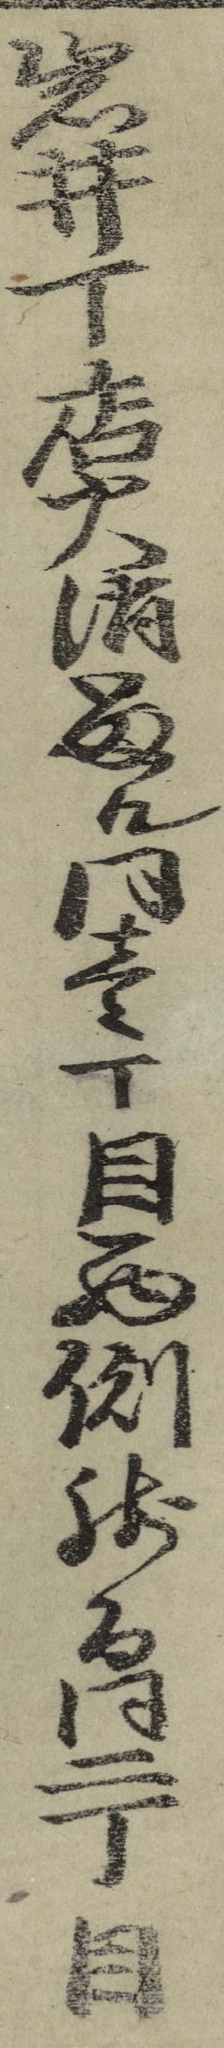岩井丁店火消留ル同壱丁目西側残る同二丁目
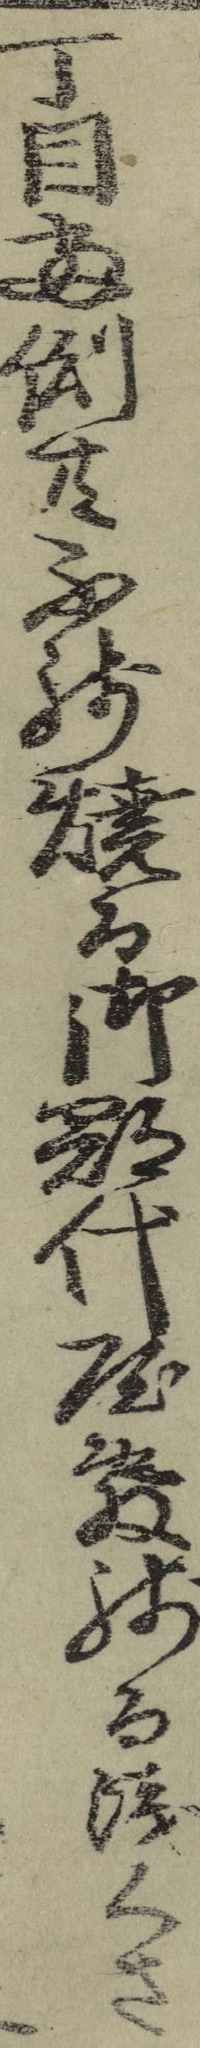丁目両側共不残焼る御郡代屋敷残る浅くさ
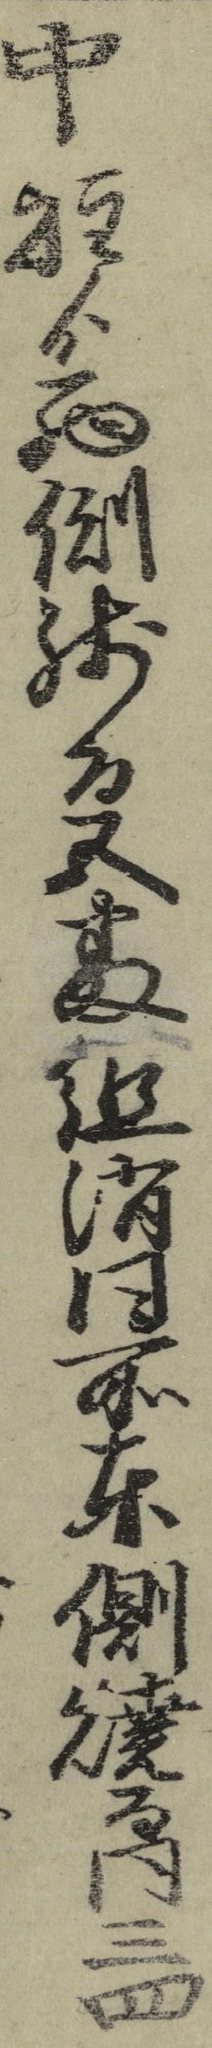中程ゟ西側残る五番組消同所東側焼る同三四
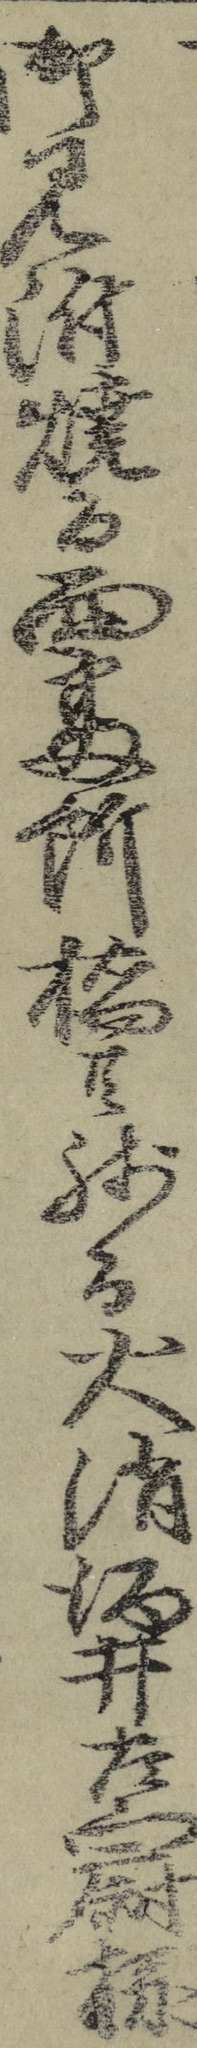御見附焼る西番所橋共残る火消酒井左衛門尉様
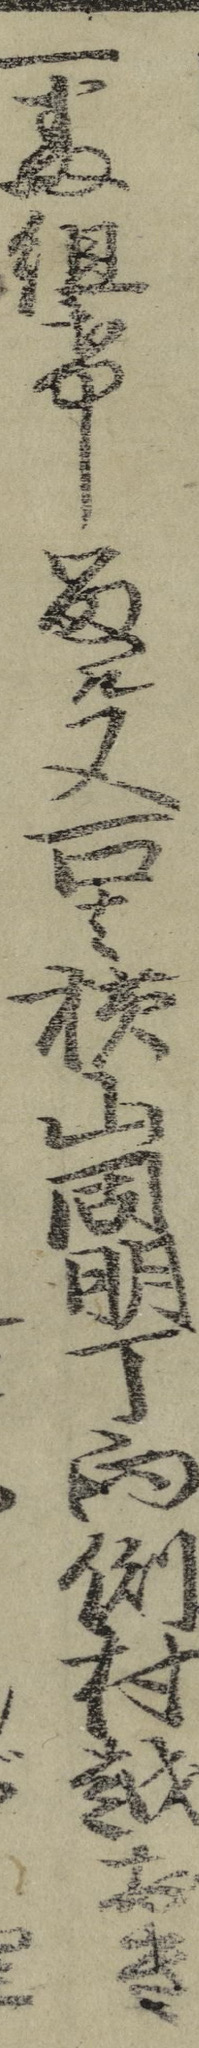一番組けし留ル又一口は横山同朋丁向側村越おき
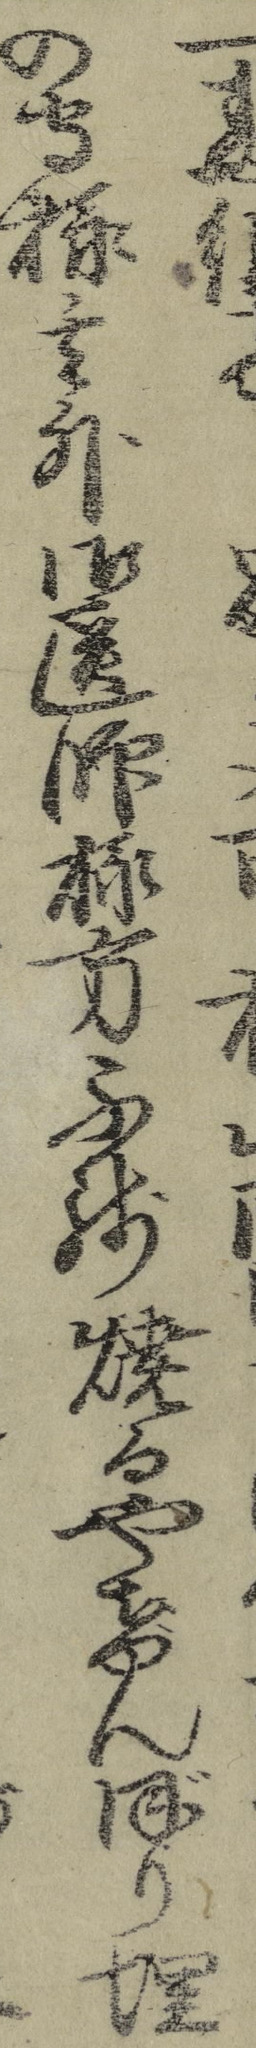の守様其外御医師様方不残焼るやげんぼり埋
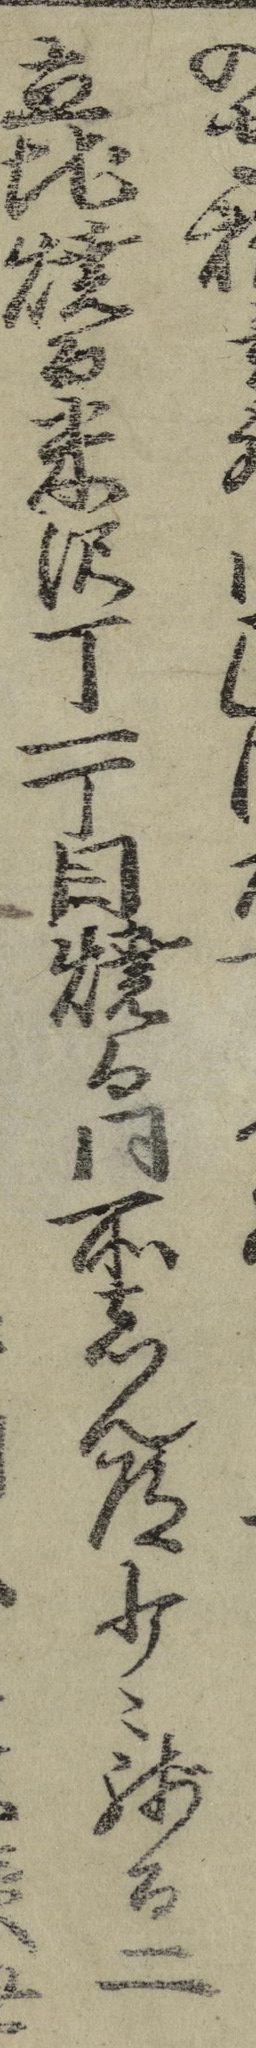立地焼る米沢丁一丁目焼る同所しん道少々残る二
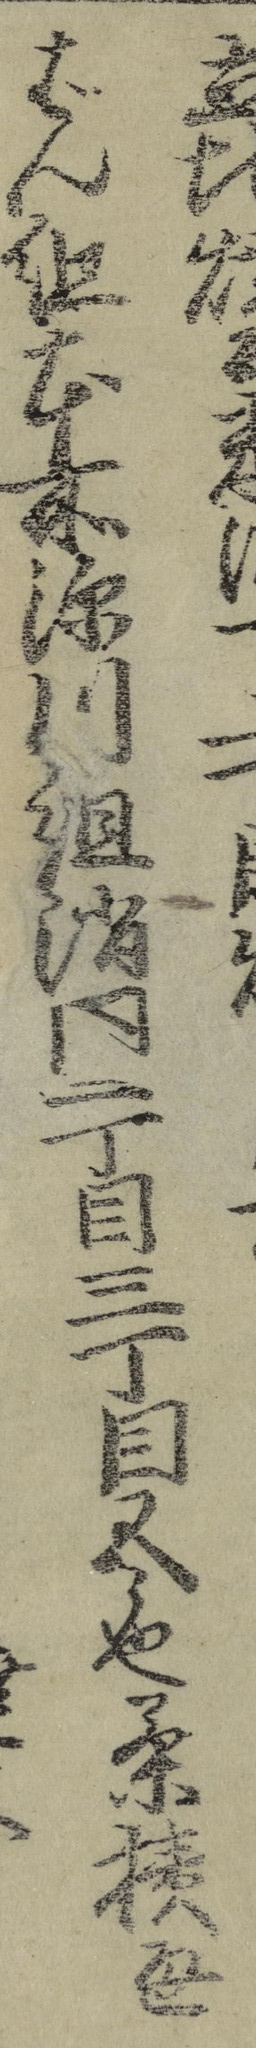ばん組本所深川組消同二丁目三丁目色々やける横通
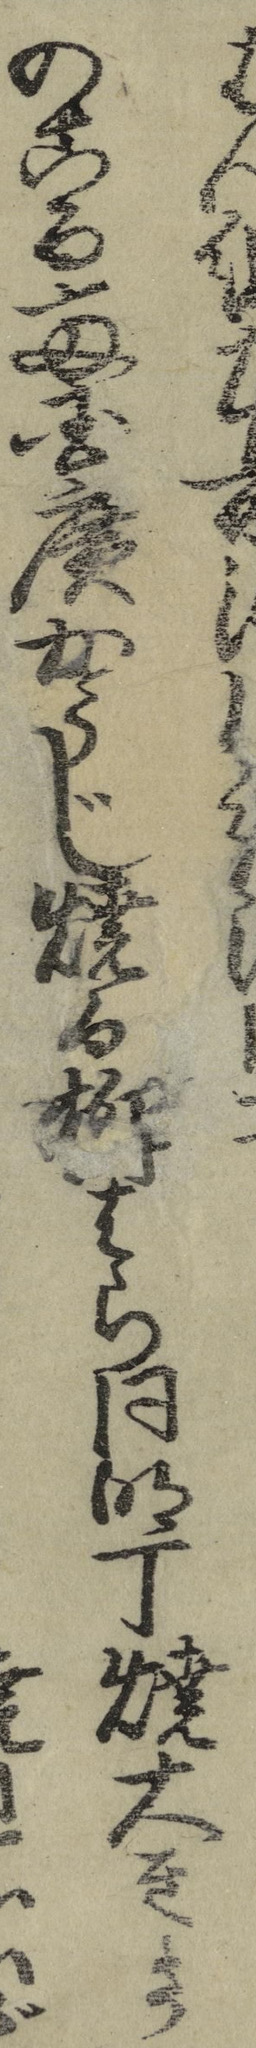のこる両国広かうじ焼る柳はら同明丁焼大さけ
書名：[安政二年三月の江戸大火に関する瓦版]
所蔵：東京大学地震研究所図書室 Earthquake Research Institute Library, The University of Tokyo, JAPAN
